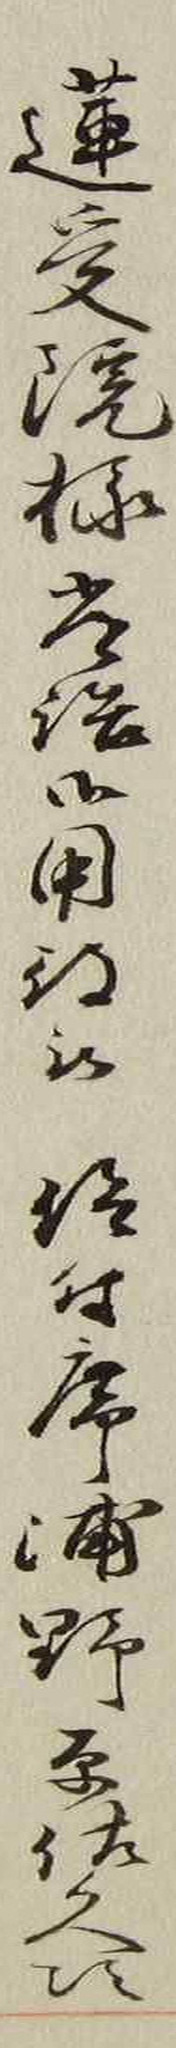蓮受院様常詰御用役被仰付席浦野原佐久頭
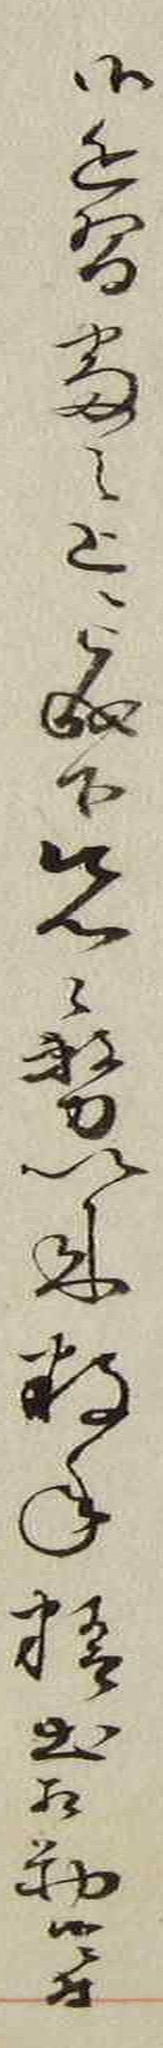御近習番之上へ被成下先々務以来数年精出相勤候ニ付
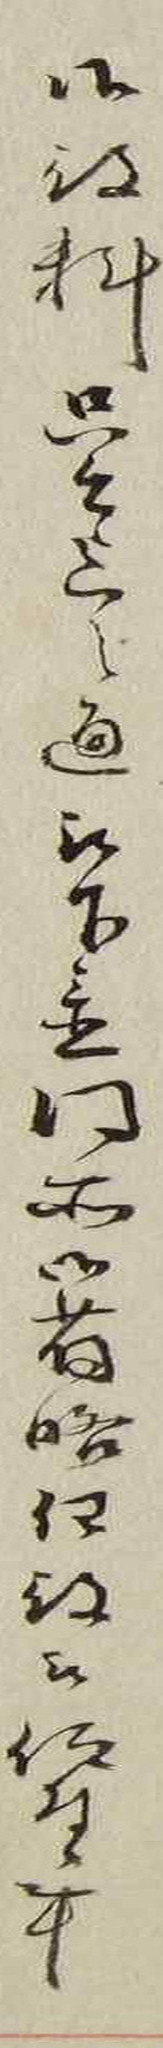御役料只今迄之通被下置同所御省略任役被仰付候事
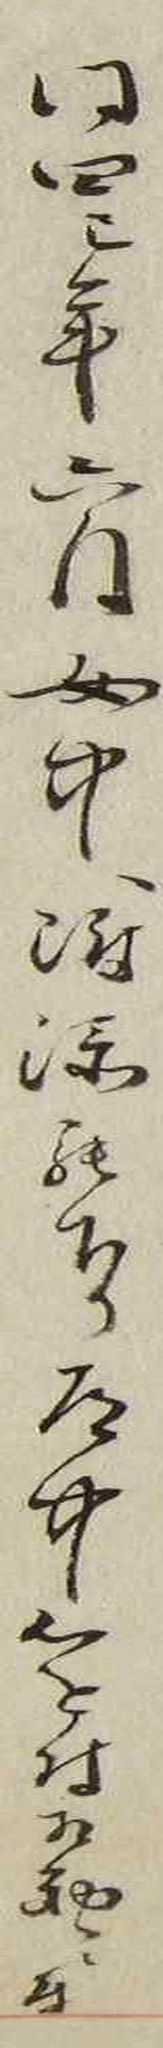一同四巳年六月女中へ附添罷下り道中心を付相勤候ニ付
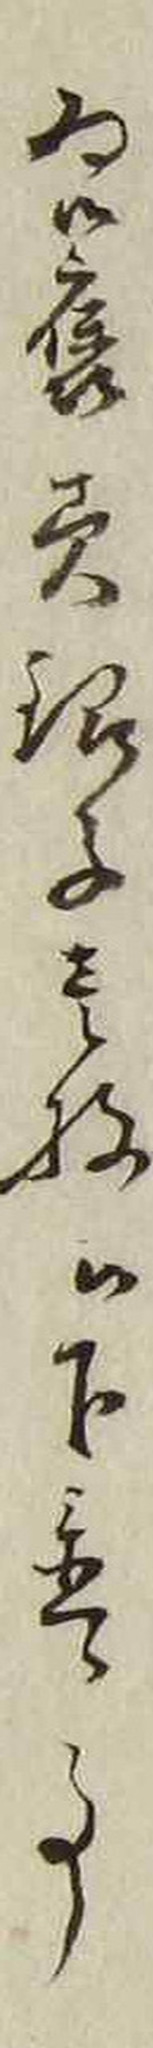為御褒美銀子壱枚被下置候事

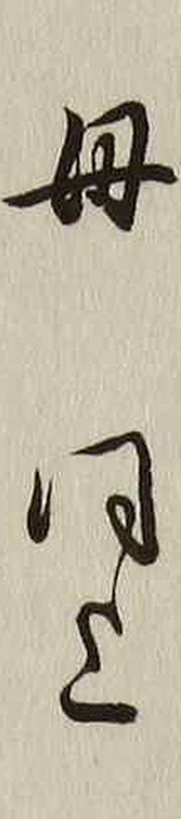母同上
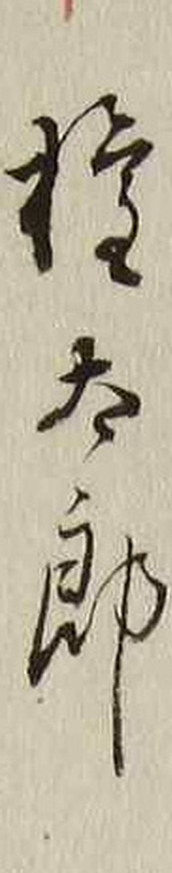権太郎
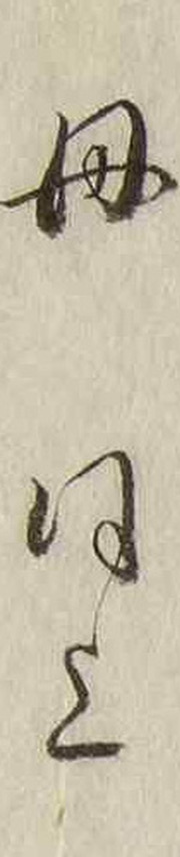母同上

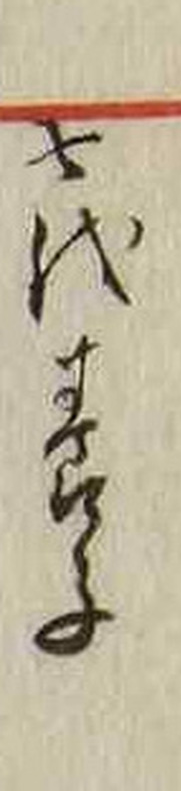七代養子
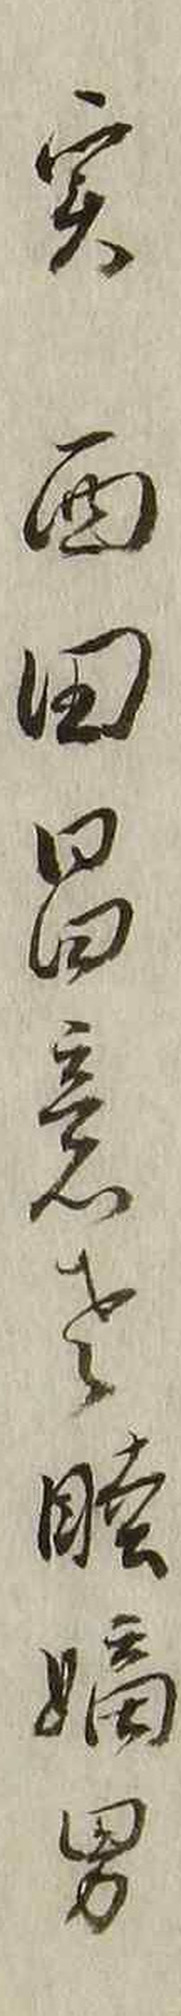実西田昌意左睦嫡男
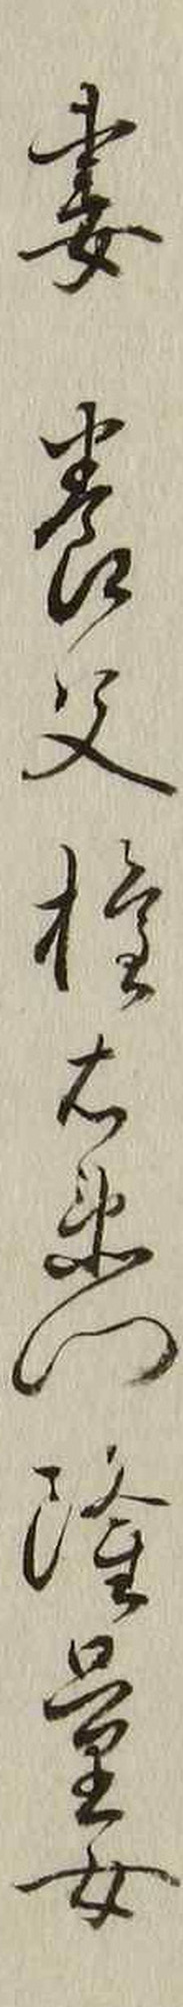妻養父権右衛門隆量女
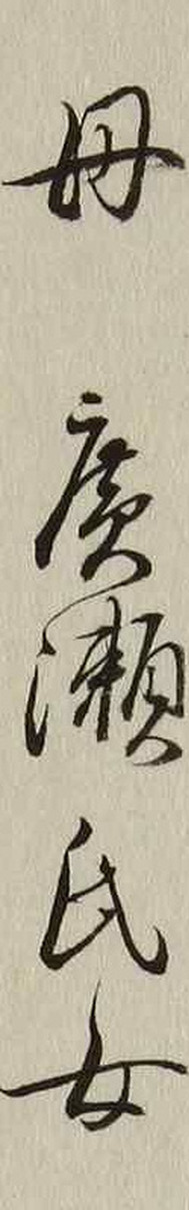母広瀬氏女
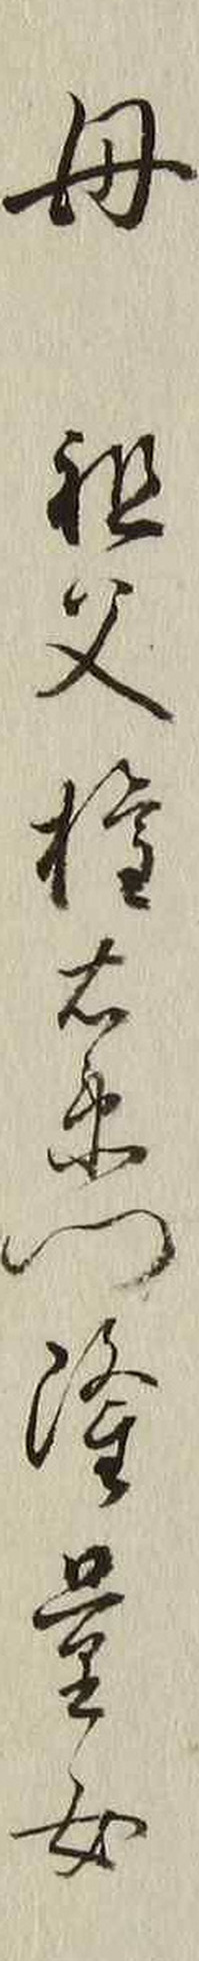母祖父権右衛門隆量女
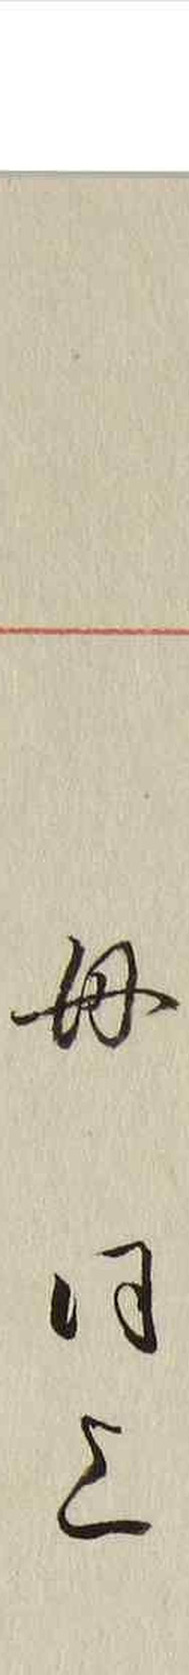母同上
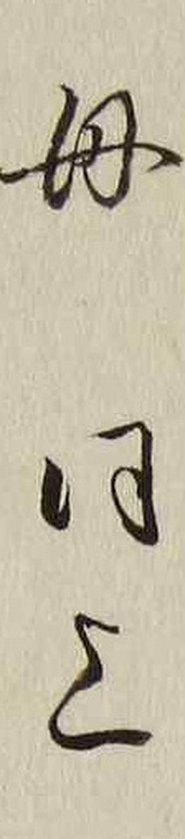母同上

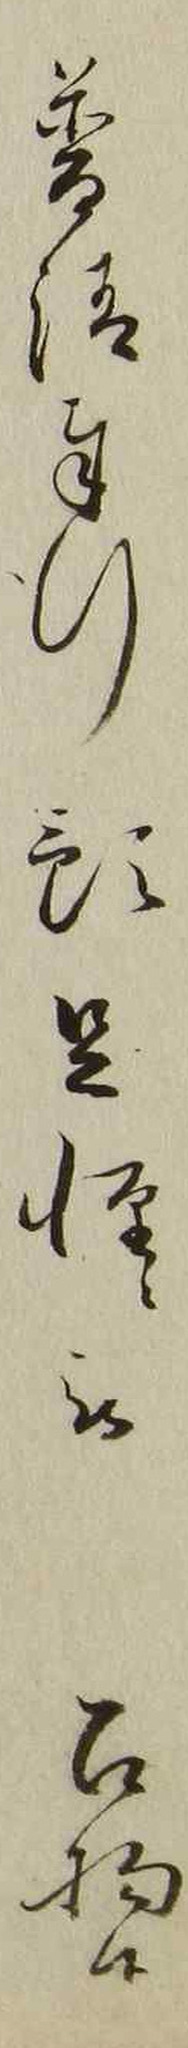普請奉行預足軽ニ被召抱候
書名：諸士系譜　巻之8　い之部8
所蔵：会津若松市立会津図書館
